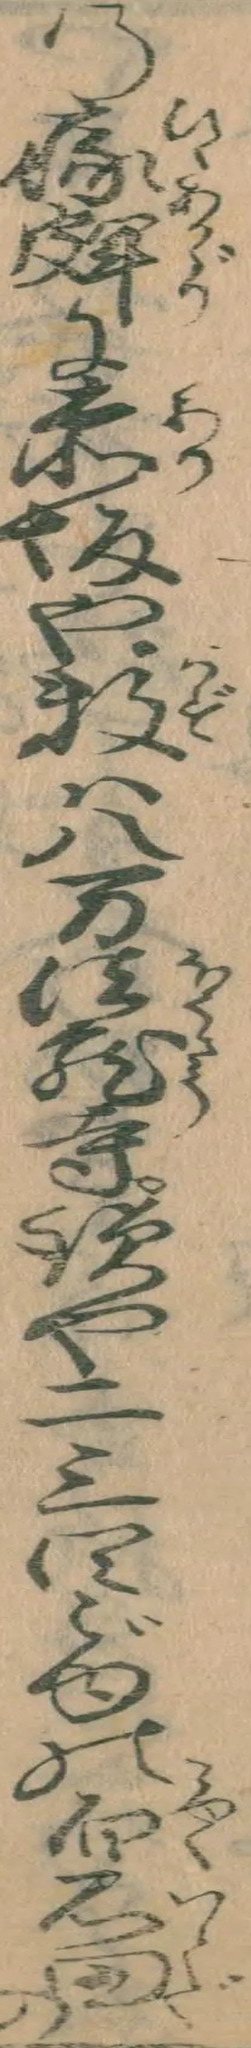の瘃皹に赤坂や。数は八万法蔵寺。歌や二三四ごゆの宿石田の
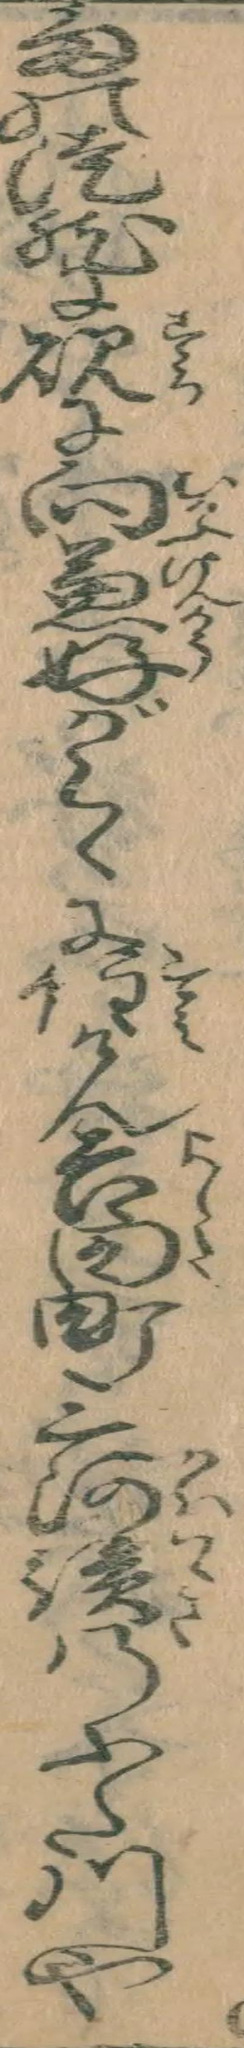雨の徒然に硯に向兼好がこゝに住けん吉田町三河続のふた川や
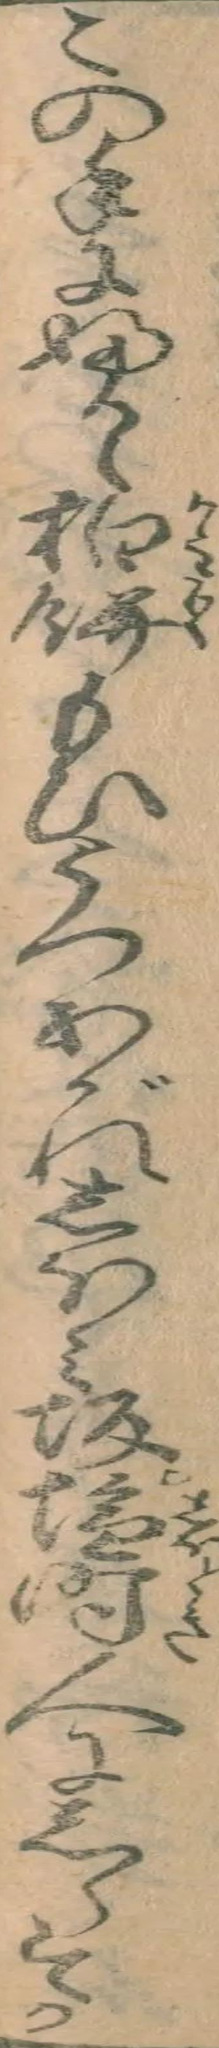この手にふるゝ柏餅もひとつあがれしほみ坂。塩時人にしらすか
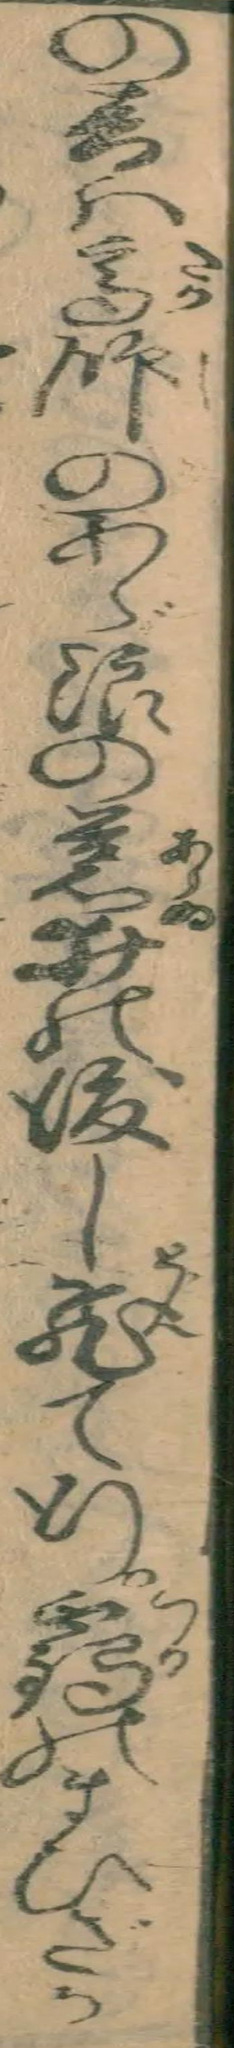の音は高師のあだ浪の荒井の渡し飛て行。鶴のまひざか
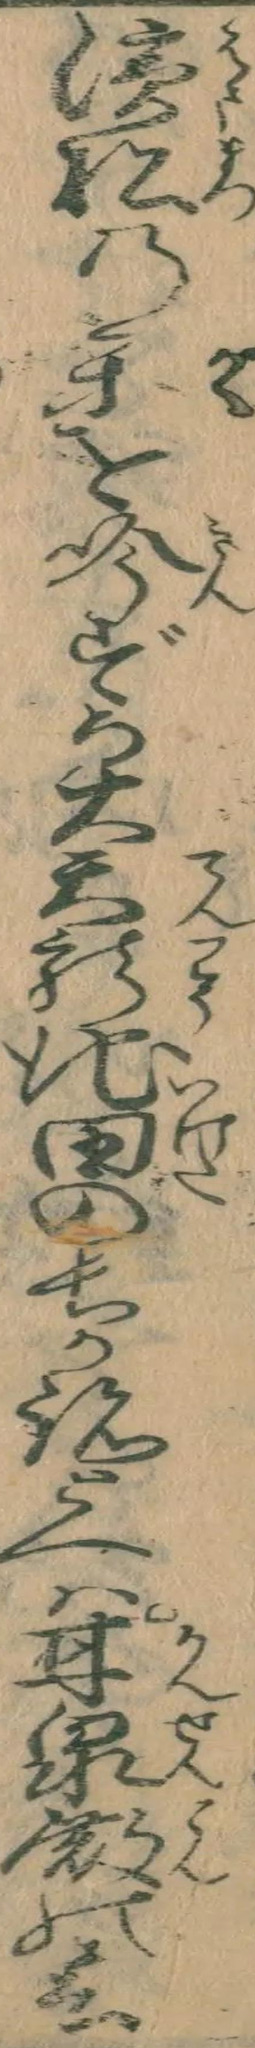浜松の楽を吟ずる大天竜池田の長か跡とへは。甘泉殿の春
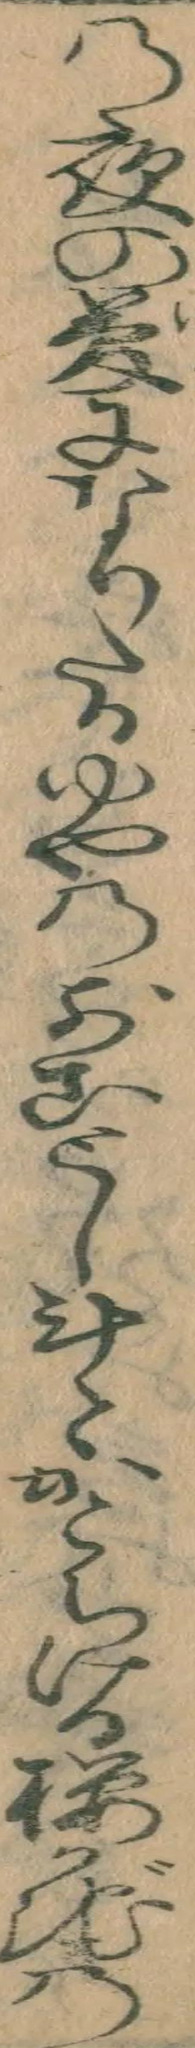の夜の夢になりたるゆやの前ことし計とかこちける桜が池の
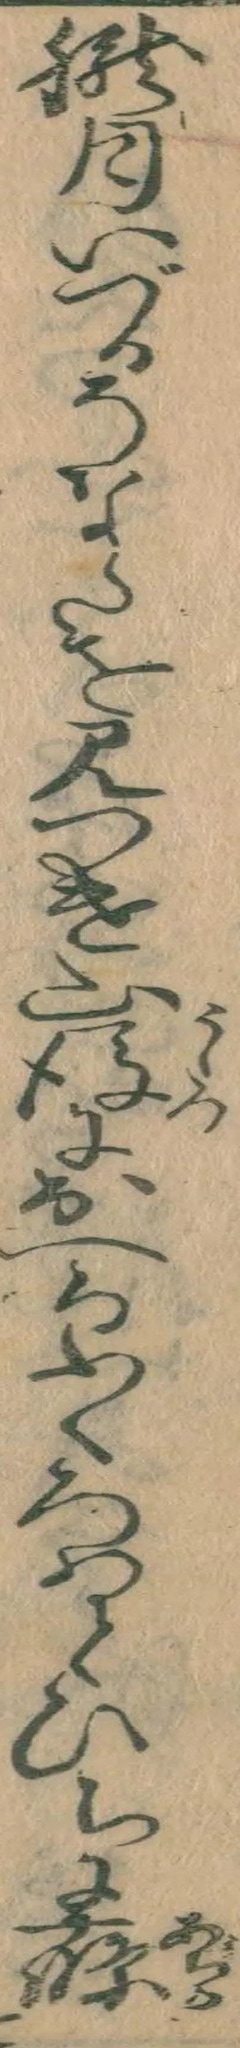朧月いづるそなたを見つけ山後におへるふくろゐとひちに簣を
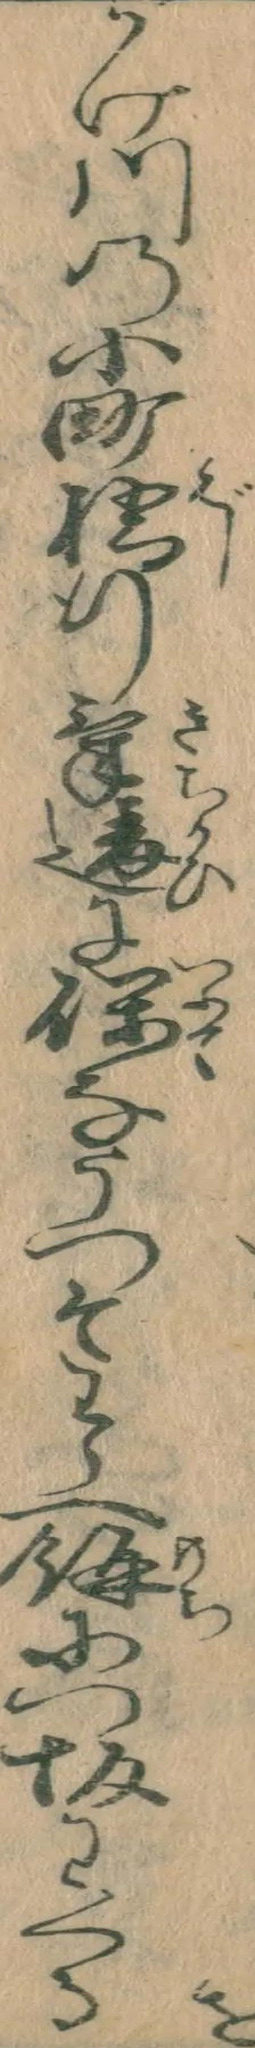かけ川の小町橋行気違に礫なうつそわらへ餅につ坂わくる
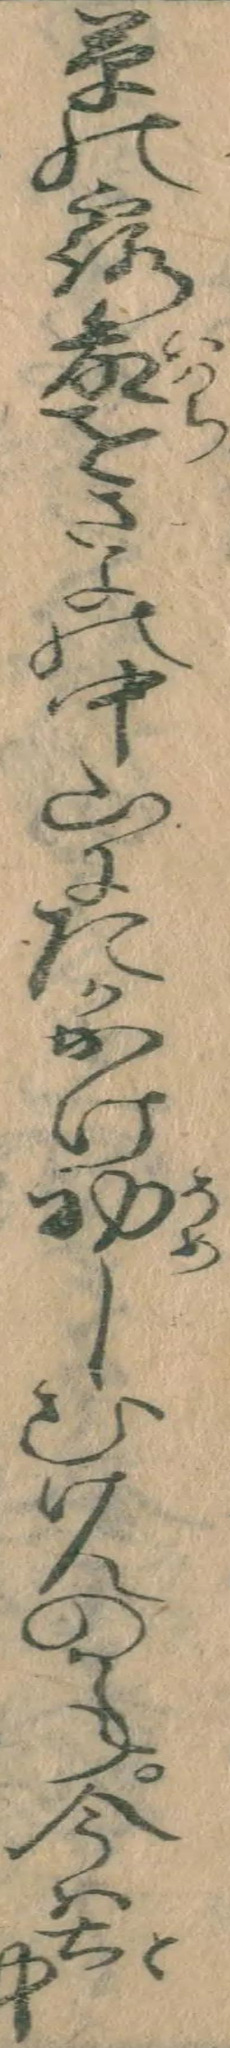草の露命をさよの中山にたかかけ初しむけんのかね。今は土中
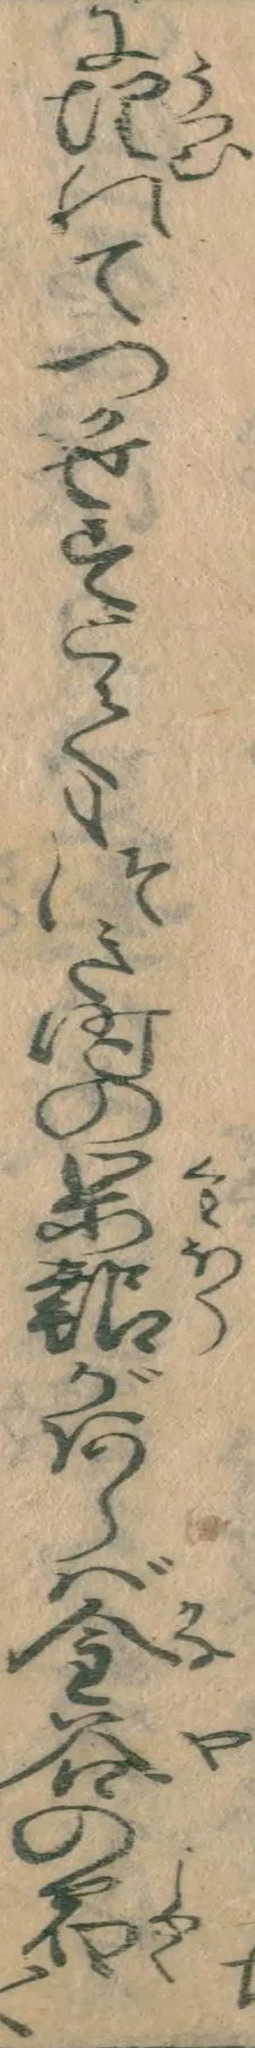に埋れてつかせすとてもつき時の果報があらば金谷の宿く
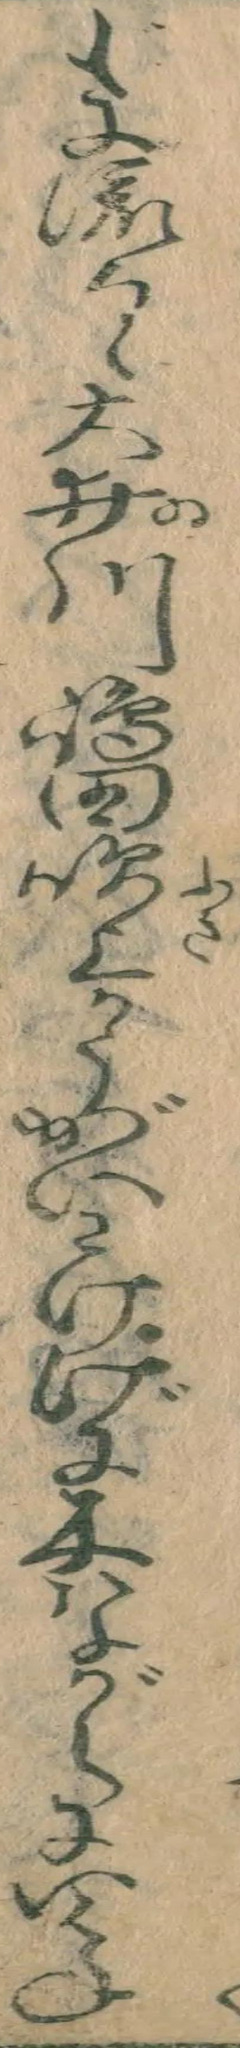もに流るゝ大井川島田吹上かうがいわけ。げに木ながらにいはね
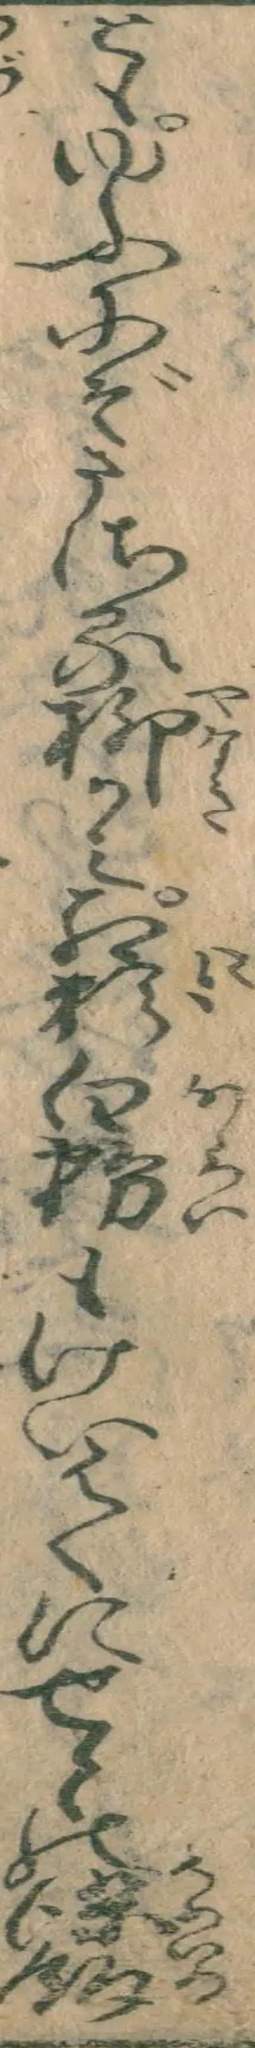とも。ゆふにぞまさる柳かみ。紅粉白粉もけいはくにせとの染飯
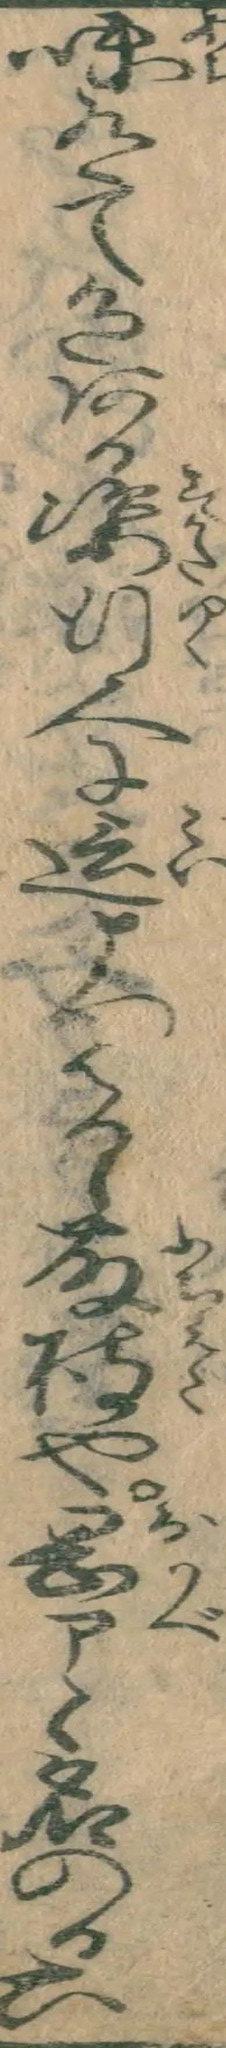味有て色ある姿行人に這まつはるゝ藤枝や。岡部と名のる六
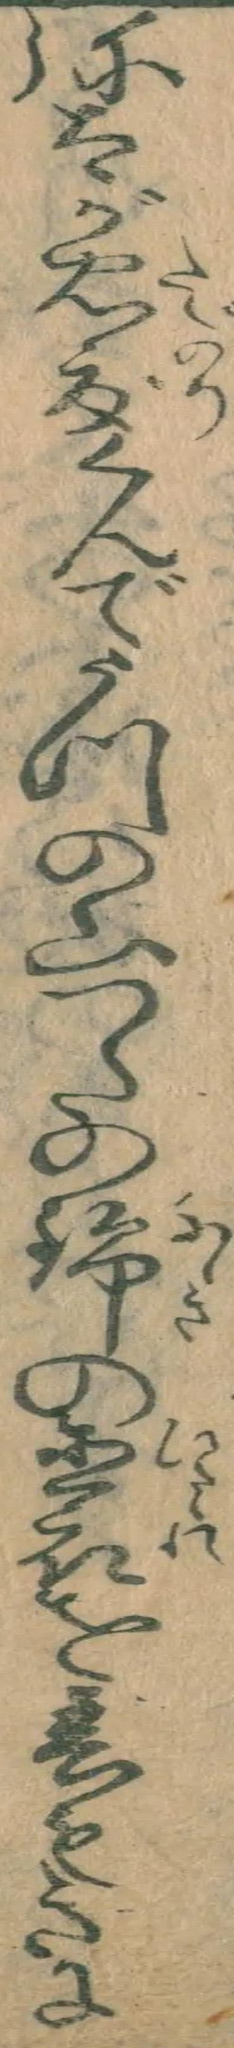弥太が忠度くんでうつの山つたの錦の直衣を春もきに

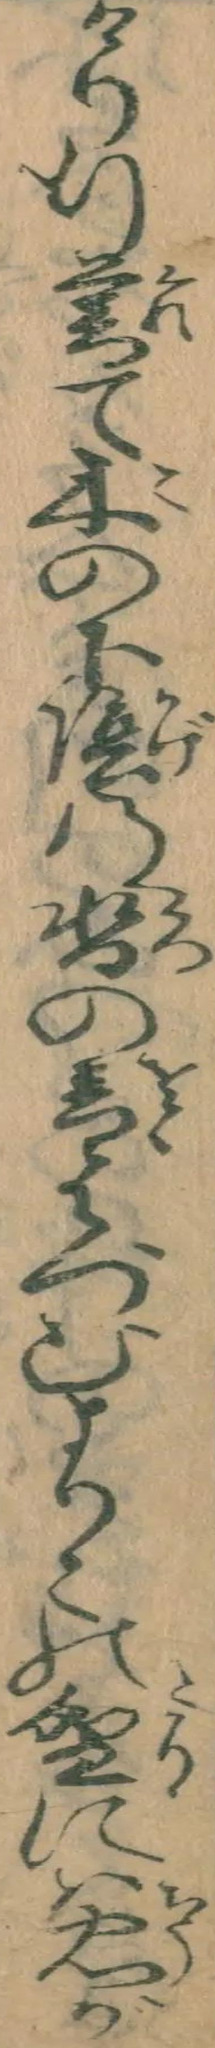けり行暮て木の下陰の沓の音はづむまりこの盛には忠が
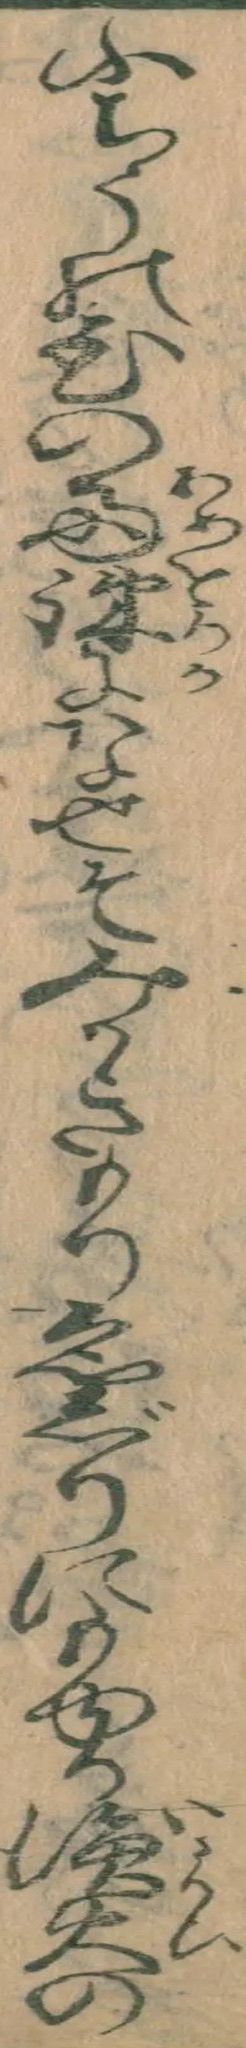ふちうの花の雨疎になせそみかきもりゑじりにもゆる漁火の
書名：新竹斎 5巻
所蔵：国立国会図書館 National Diet Library, JAPAN
